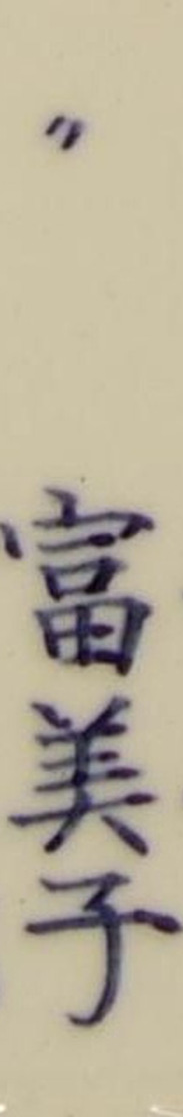富美子
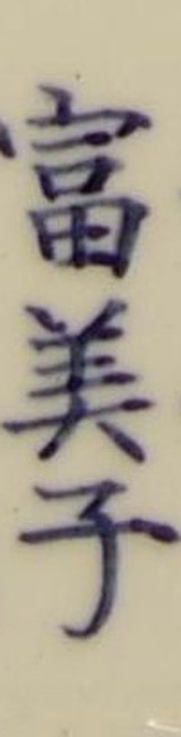富美子
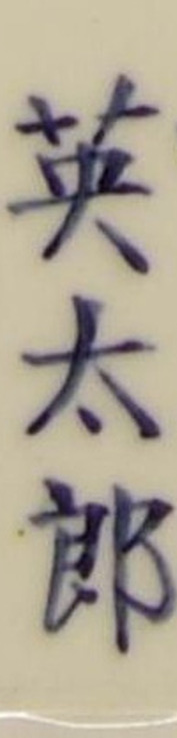英太郎
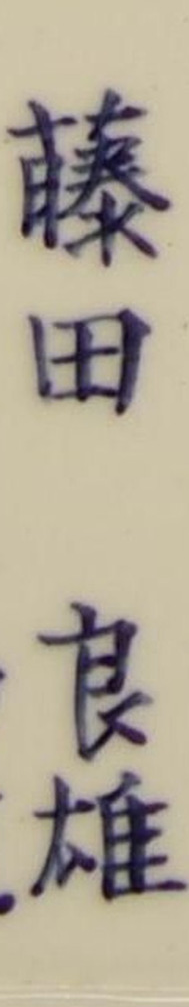藤田良雄

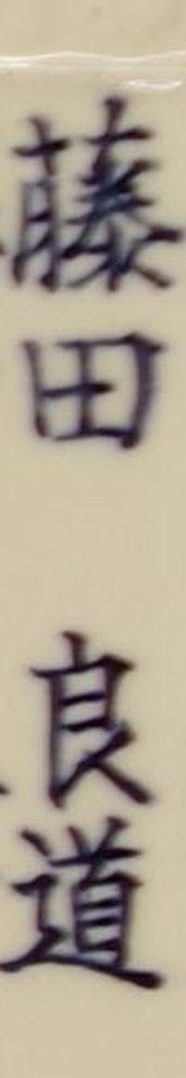藤田良道
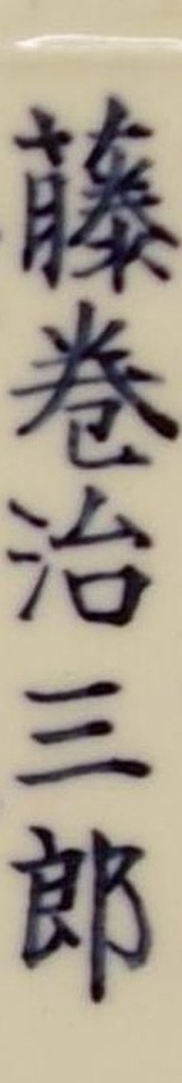藤巻治三郎
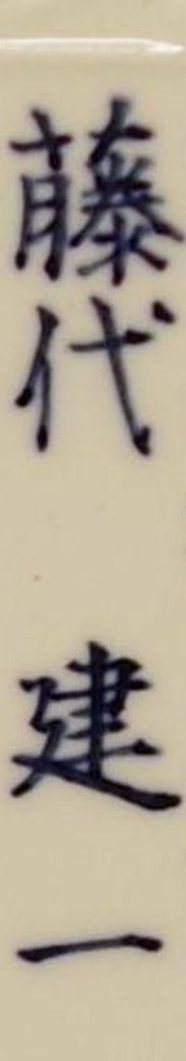藤代建一
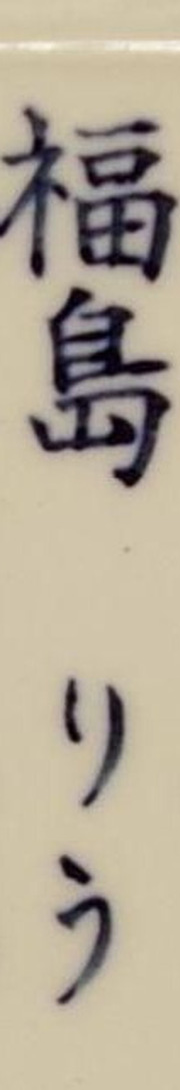福島りう
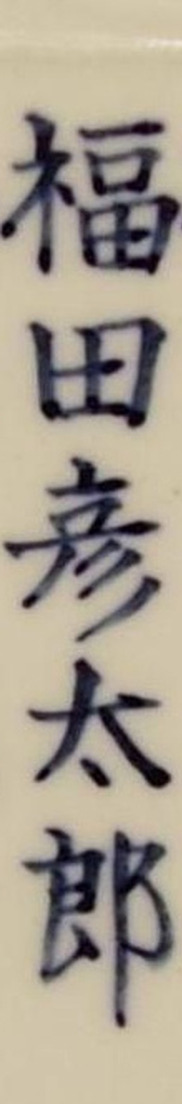福田彦太郎
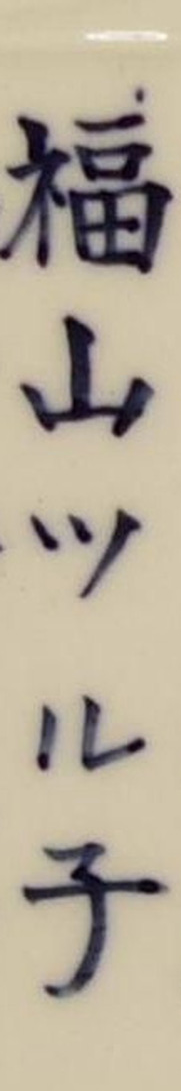福山ツル子
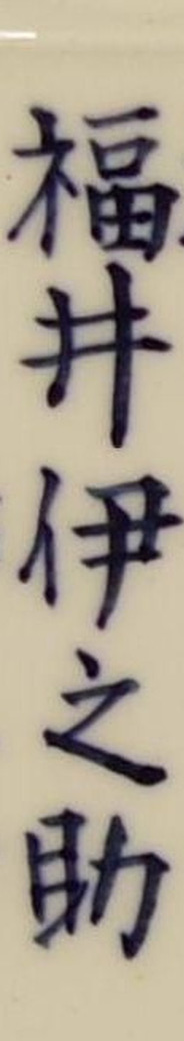福井伊之助
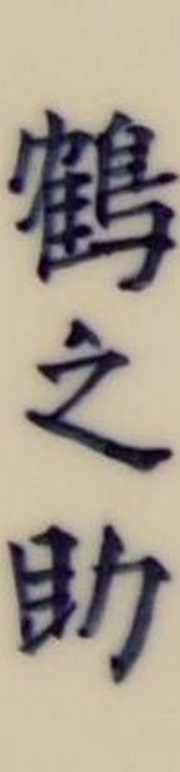鶴之助
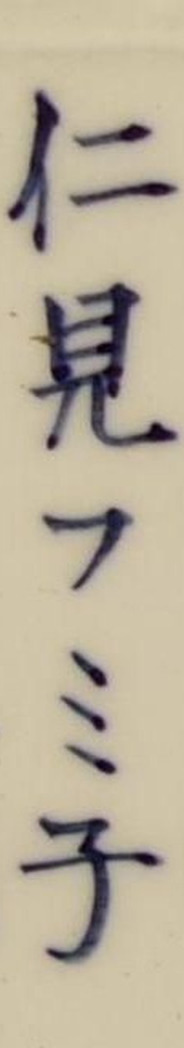仁見フミ子
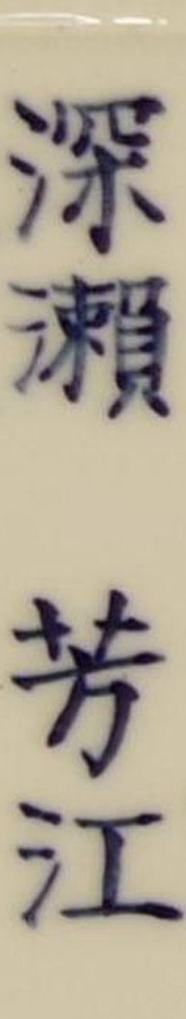深瀬芳江
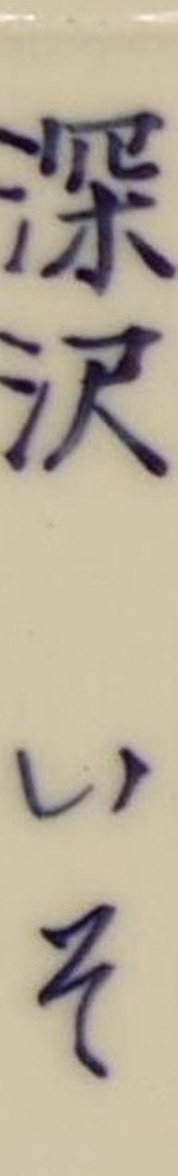深沢いそ
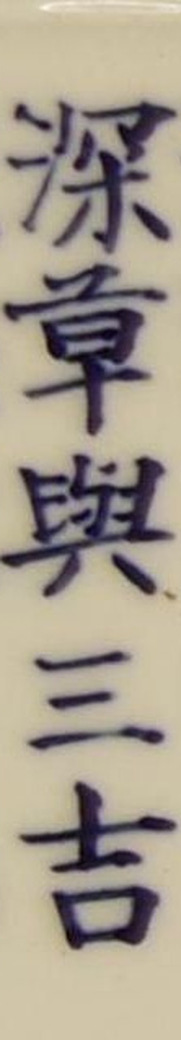深草與三吉
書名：E~L
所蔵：高野山金剛峯寺
